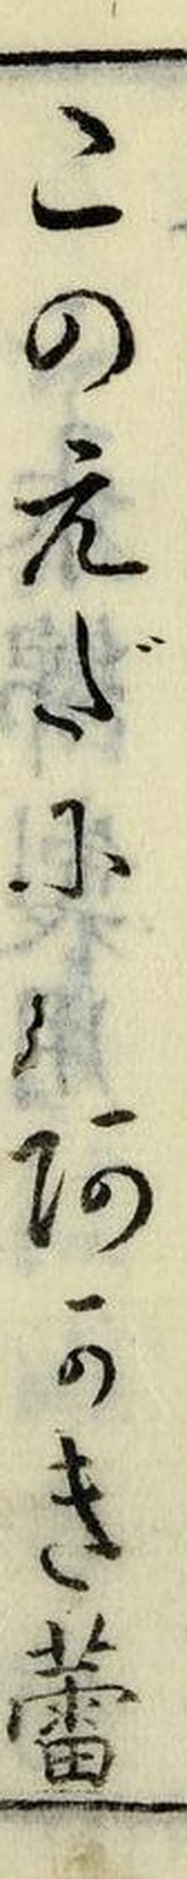このえだにあかき蕾
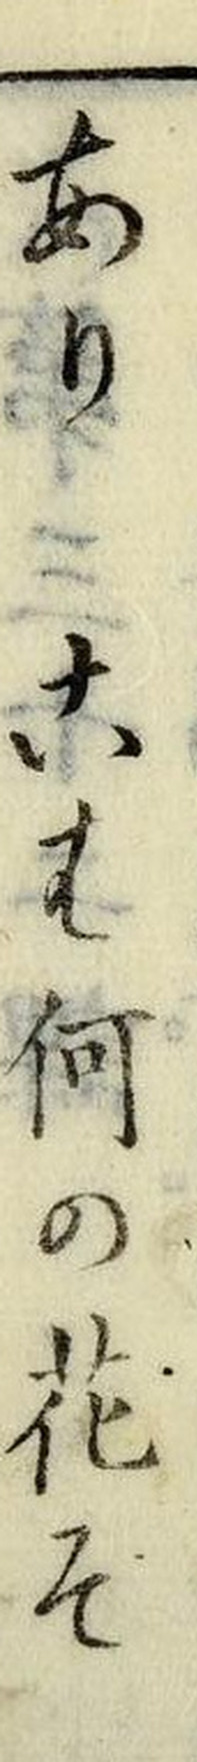ありこは何の花そ
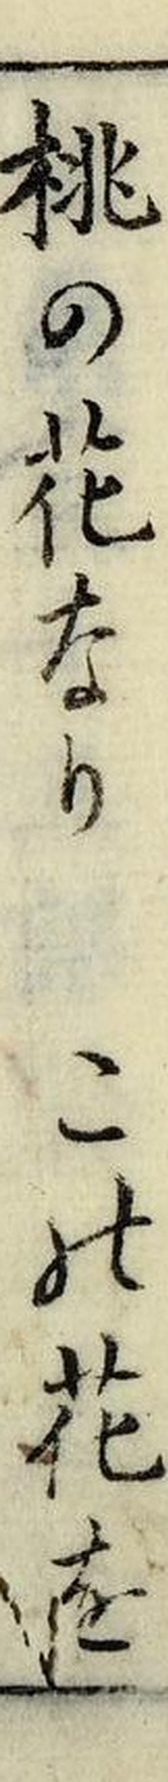桃の花なりこの花を
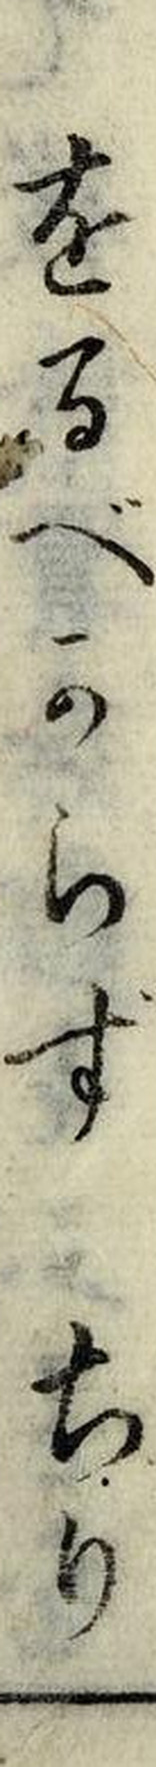をるべからずちり

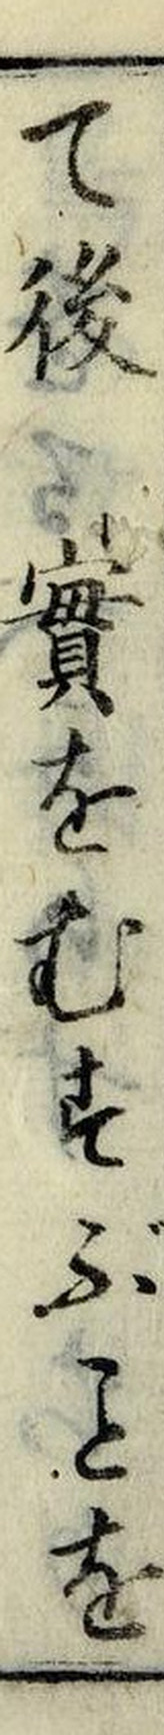て後実をむすぶことを
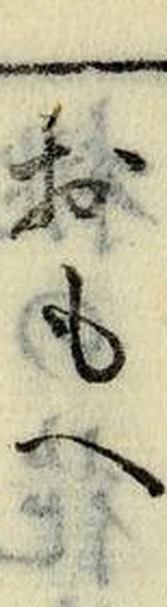おもへ
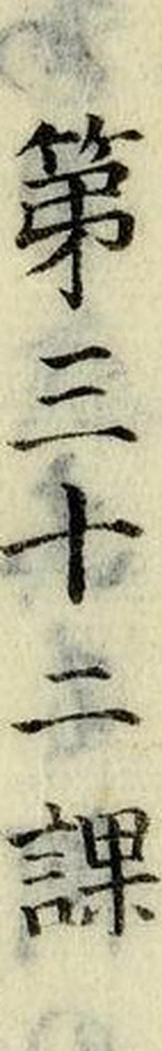第三十二課
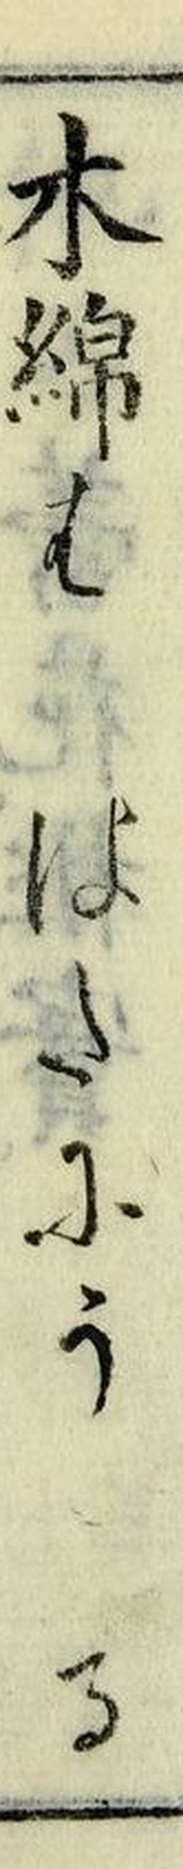木綿ははたなうる
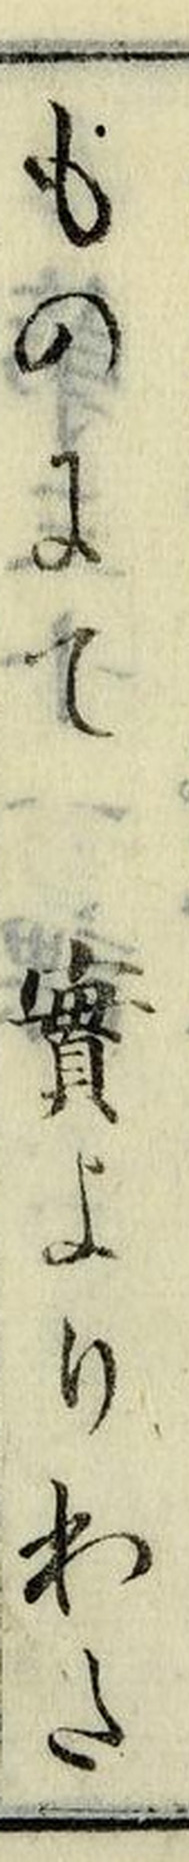ものまて実よりわた
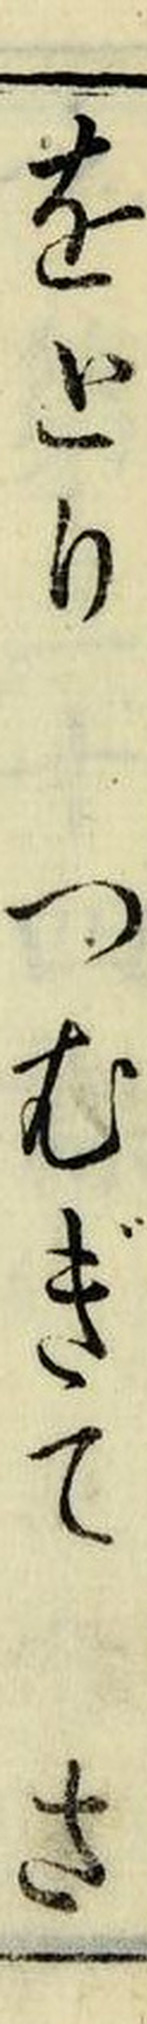をとりつむぎてさ
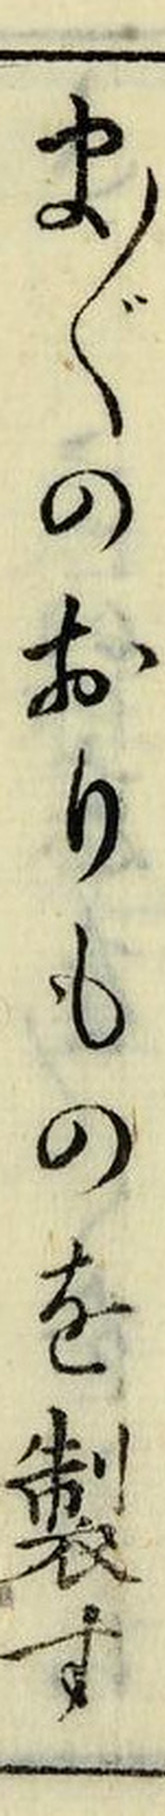ま〴〵のおりものを製す
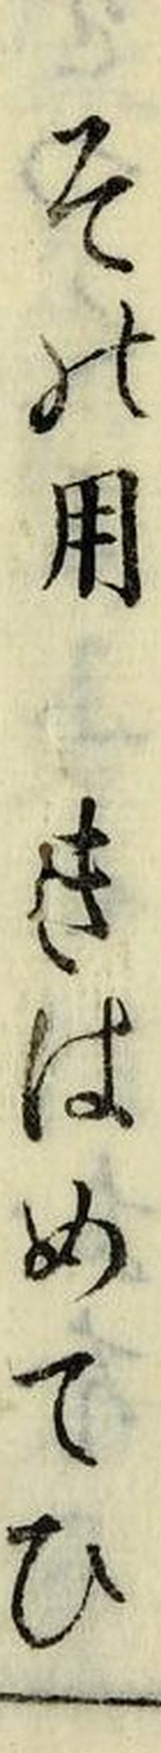その用きはめてひ
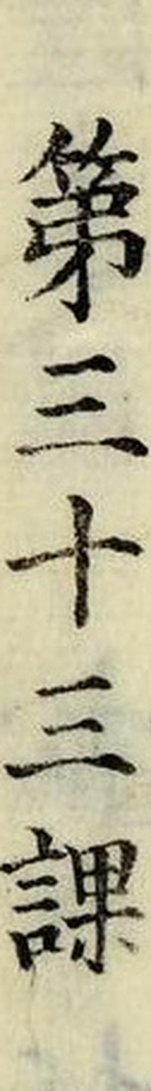第三十三課
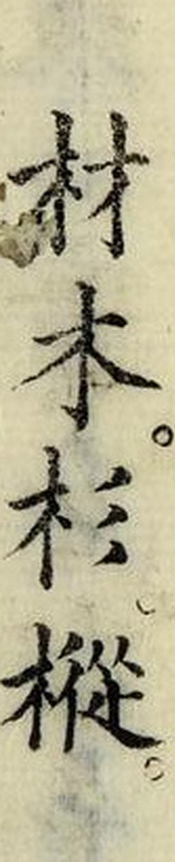材木。杉。樅。

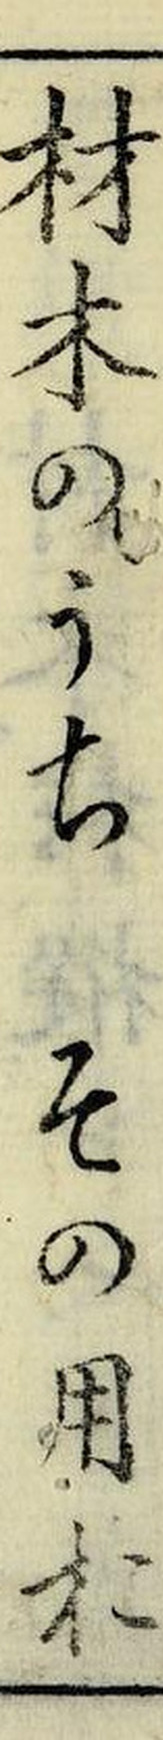材木のうちその用お
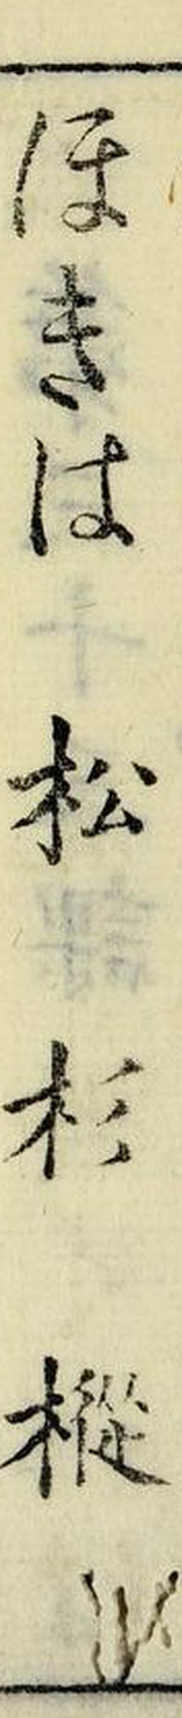ほきは松杉樅
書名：小学読本 初等科 巻一
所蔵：福井県文書館 Fukui Prefectural Archives
